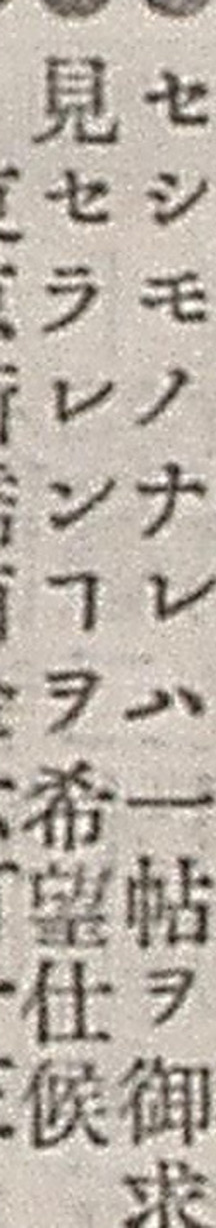●見セラレンヿヲ希望仕候
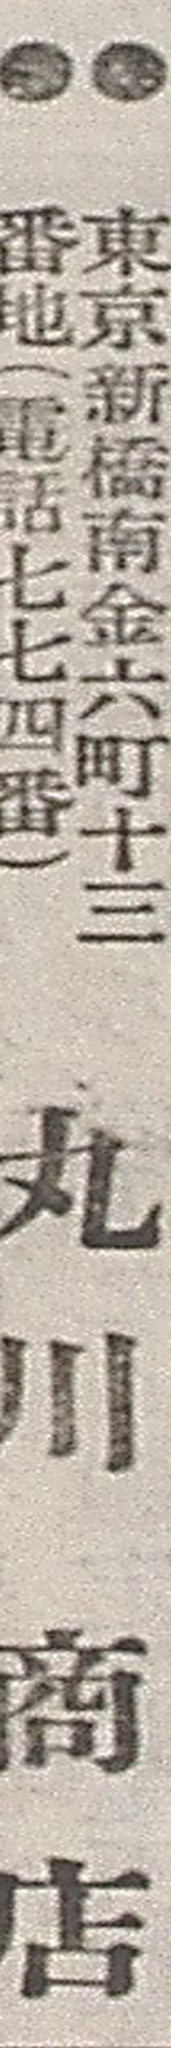●東京新橋南金六町十三丸川商店
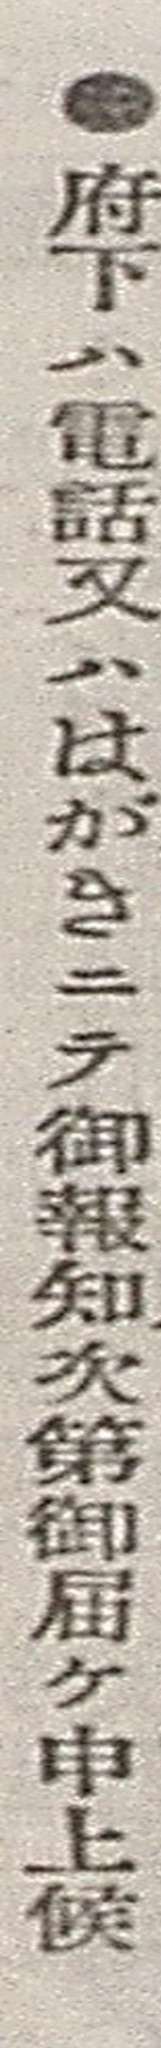●府下ハ電話又ハはがきニテ御報知次第御届ケ申上候
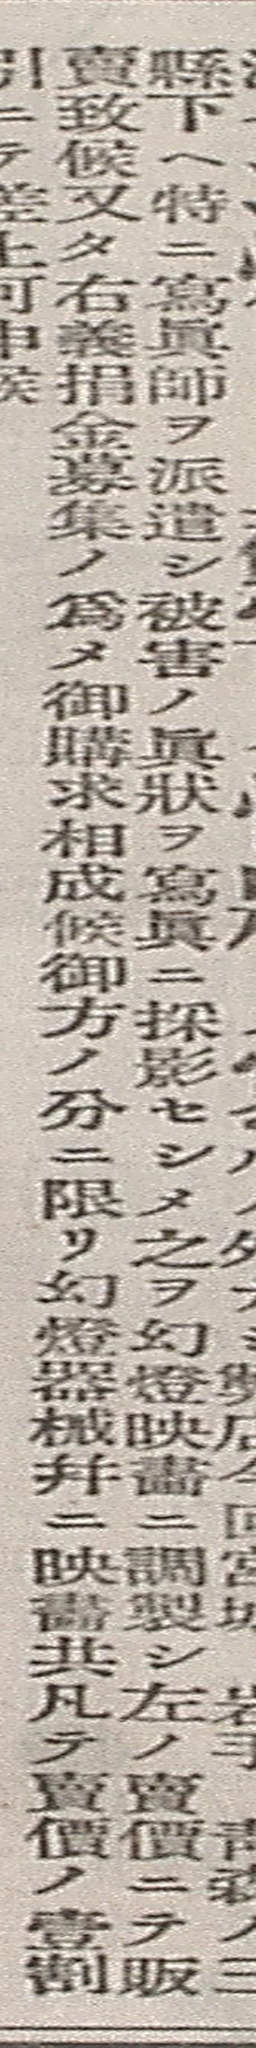売致候又タ右義援金募集ノ為メ御請求相成候御方ノ分二限リ幻燈機械并に映画共凡テ売買ノ一割
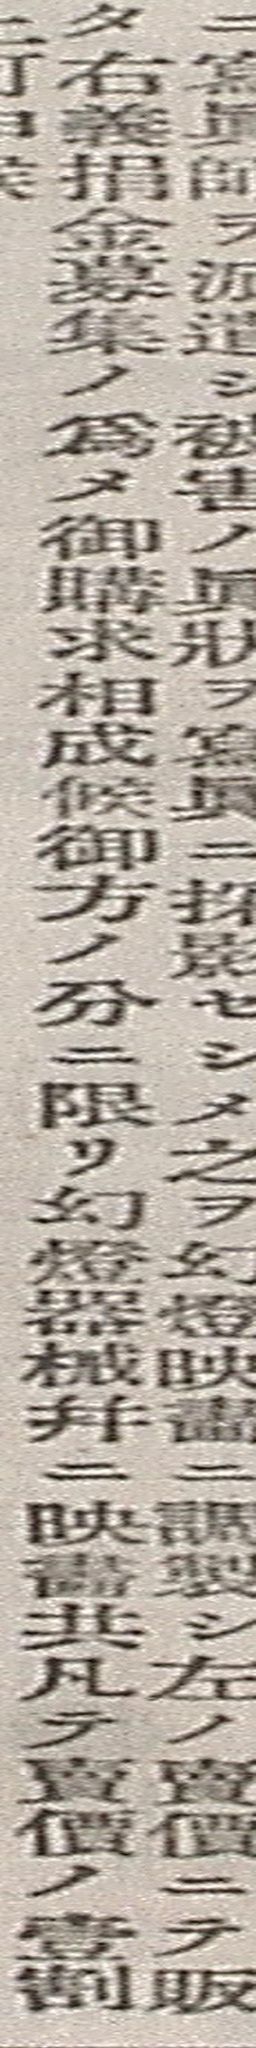売致候又タ右義援金募集ノ為メ御請求相成候御方ノ分二限リ幻燈機械并に映画共凡テ売買ノ一割
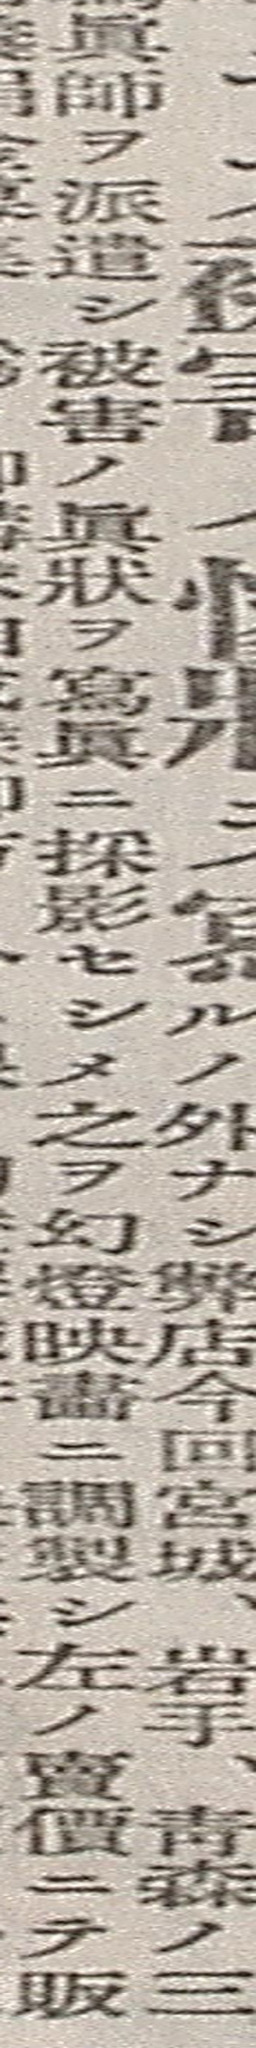県下へ特二写真師ヲ派遣シ被害ノ真状ヲ写真二採影セシメ之ヲ幻燈映画二調整シ左ノ売買ニテ販
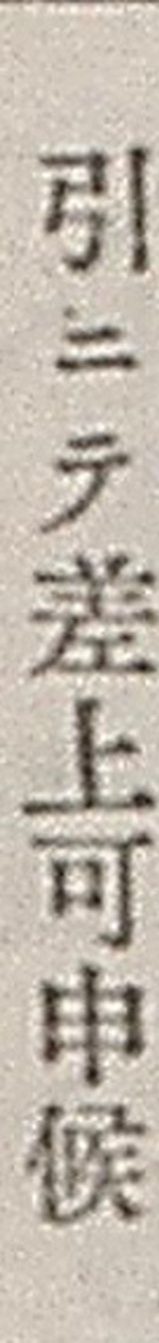引ニテ差上可申候
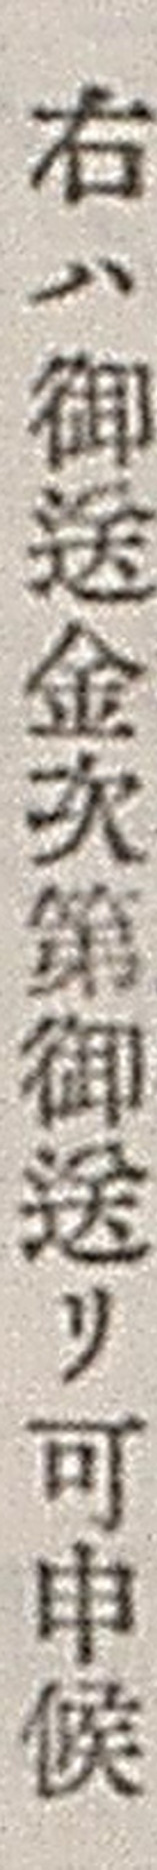右ハ御送金次第御送リ可申候
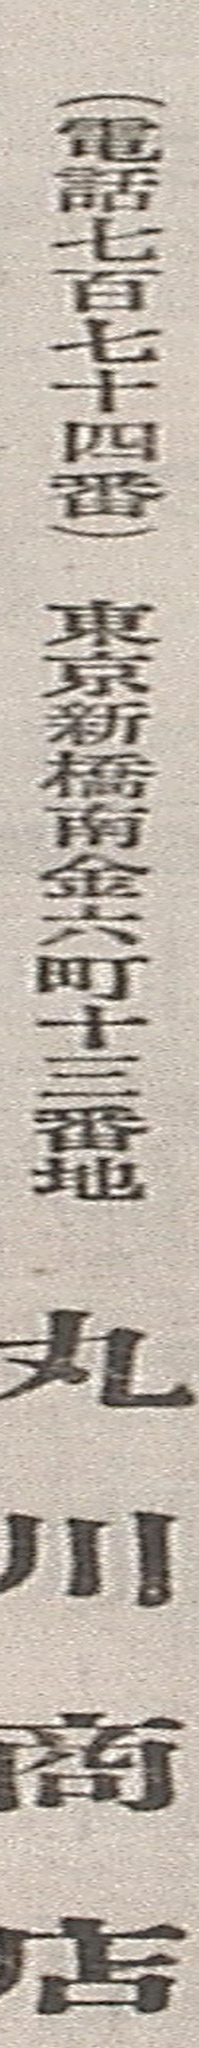東京新橋南金六町十三番地丸川商店
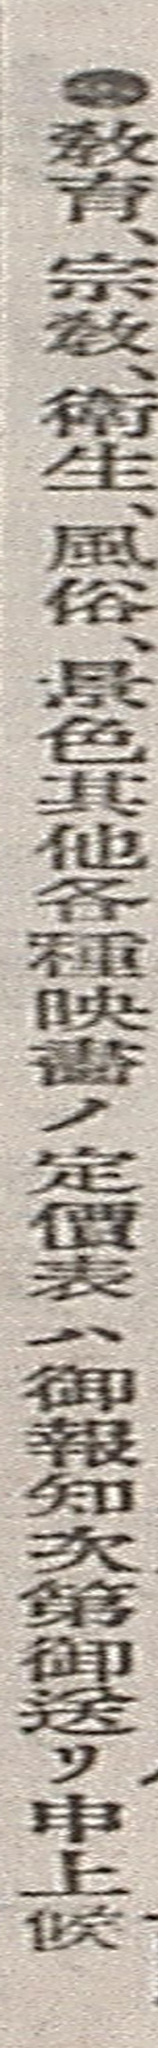●教育、宗教、衛生、風俗、景色其他各種映画の定価表ハ御報知次第御送リ申上候
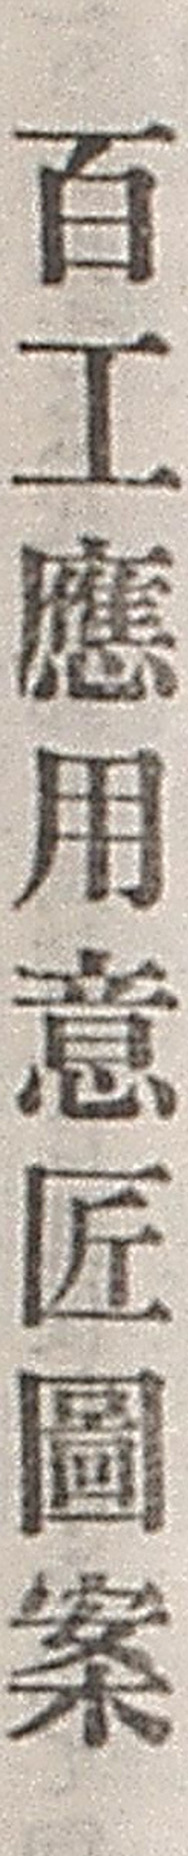百工応用意匠図案
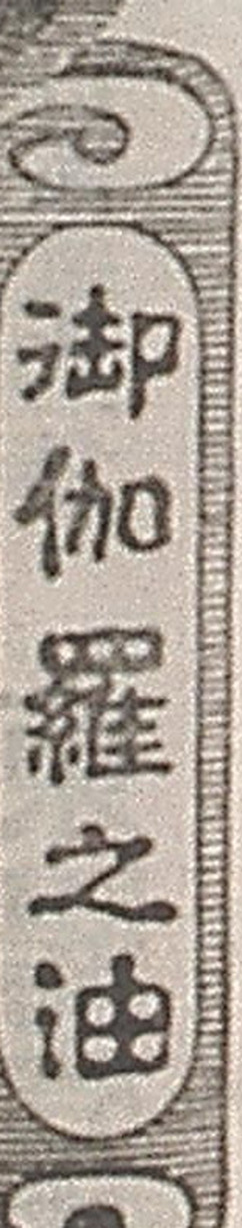御伽羅之油
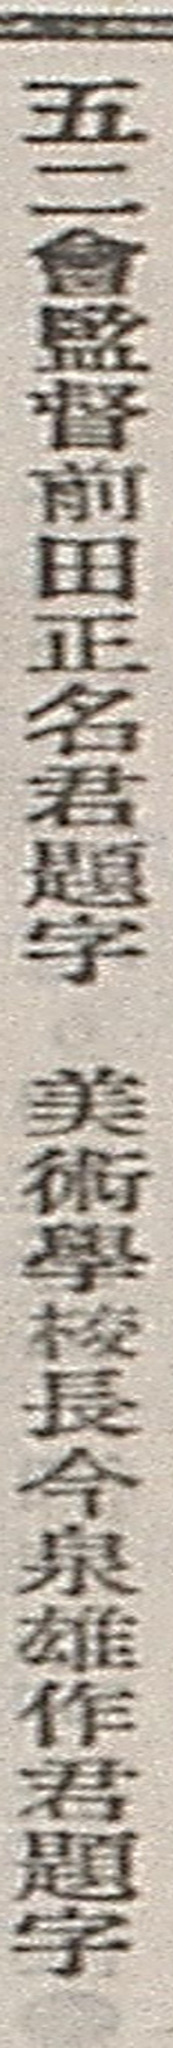五二会監督前田正名君題字美術学校長今泉雄作君題字
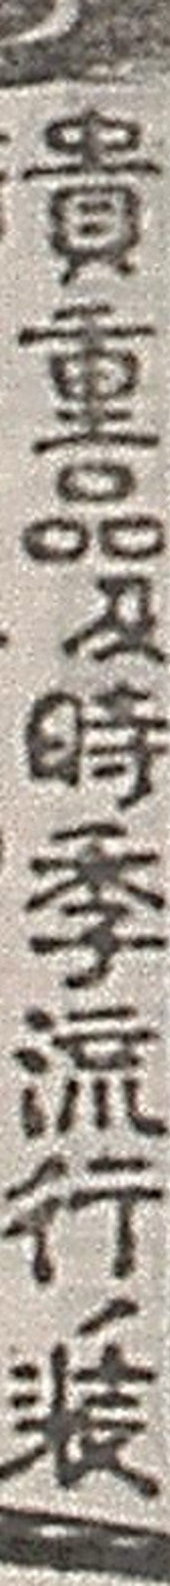貴重品及時季流行ノ装
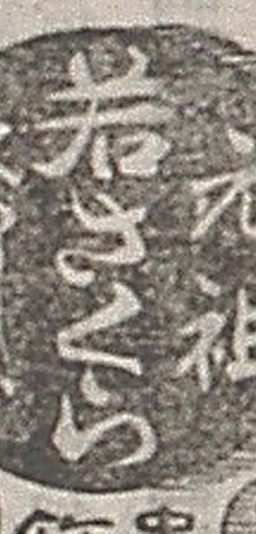若さくら
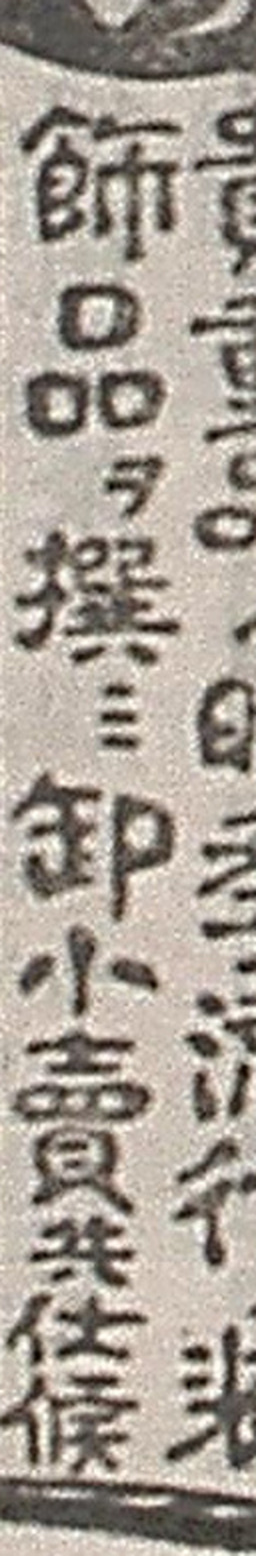飾品ヲ撰ミ卸小売共仕候
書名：風俗畫報臨時増刊第百十九號　大海嘯被害録（中）
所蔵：東京大学地震研究所図書室 Earthquake Research Institute Library, The University of Tokyo, JAPAN
